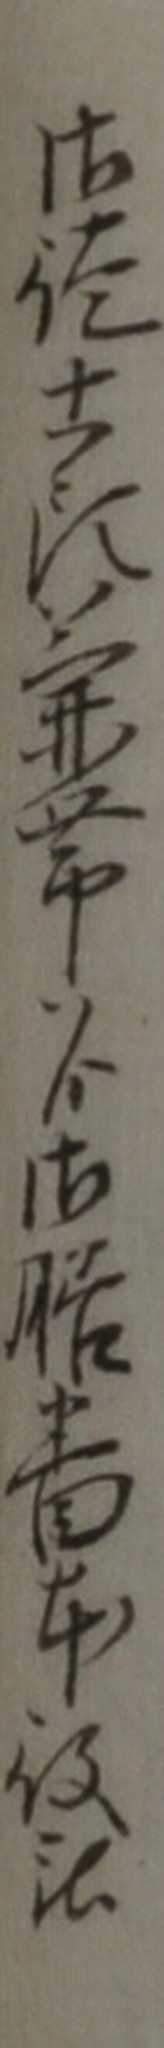御徒士頭兼帯ゟ御膳番本役被
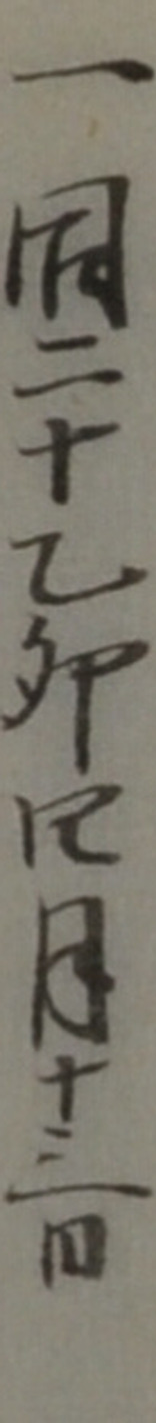一同二十乙卯四月十三日
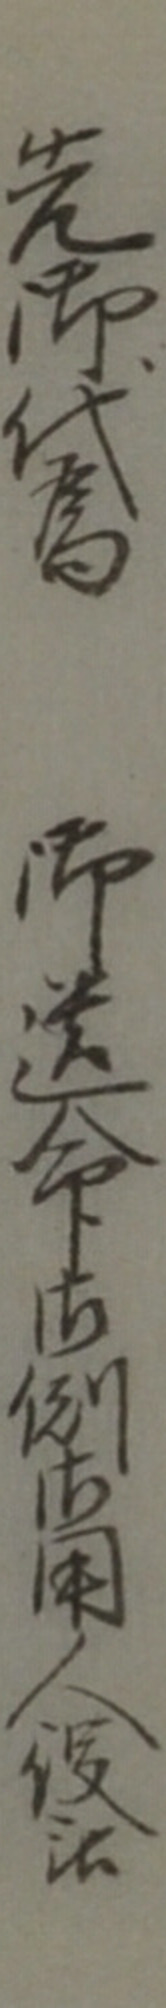先御代為御遺命御側御用人役被
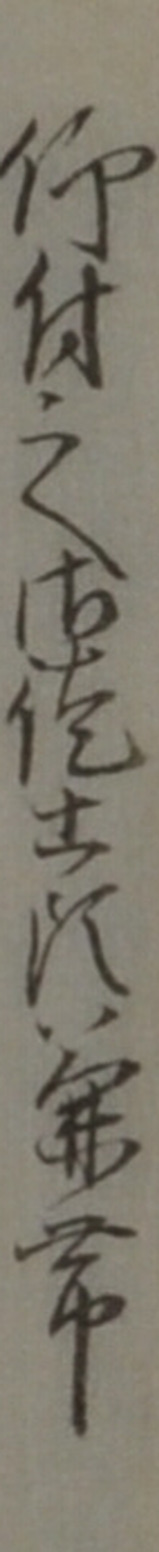仰付之御徒士頭兼帯
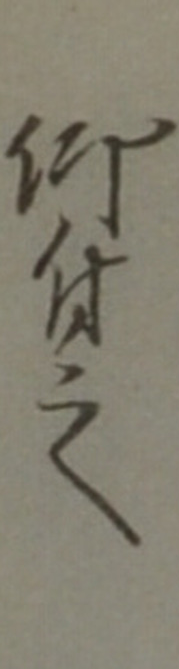仰付之
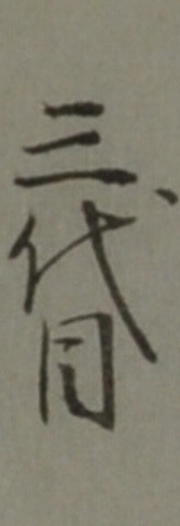三代目
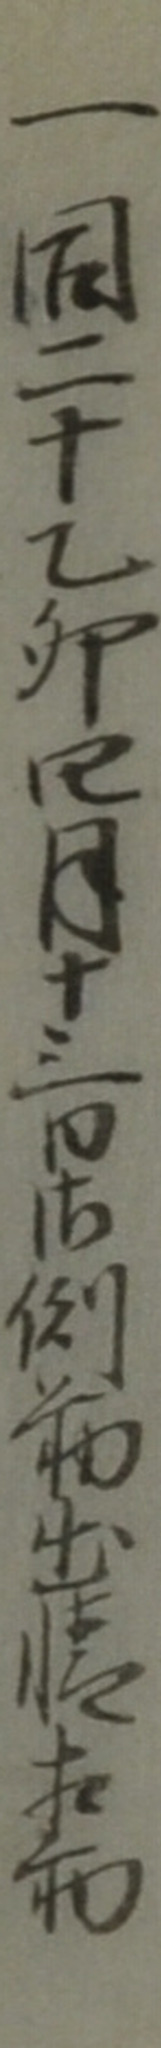一同二十乙卯四月十三日御側勤出精相勤
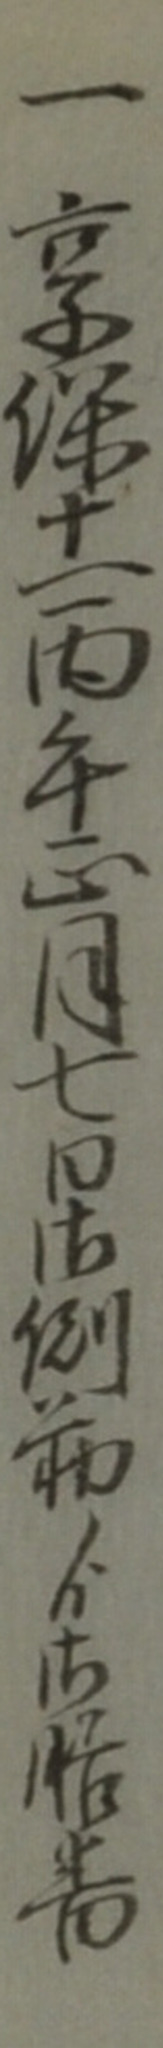一享保十一丙午正月七日御側勤ゟ御膳番
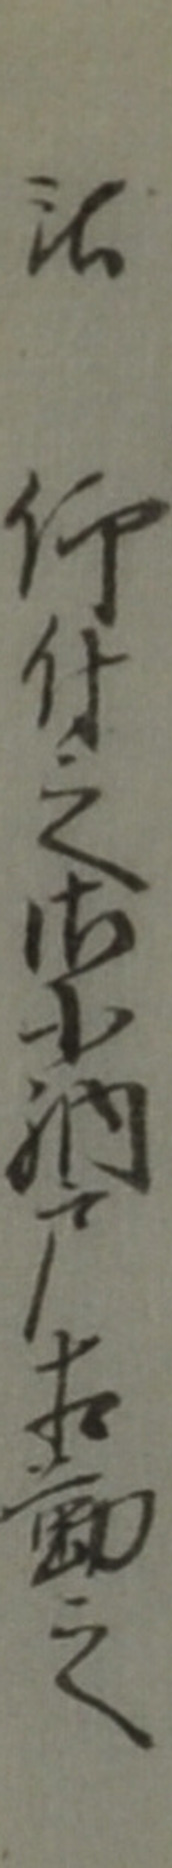被仰付之御小納戸相勤之
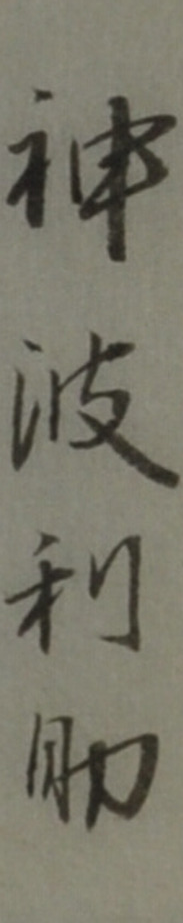神波利助
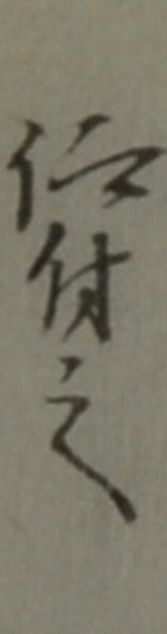仰付之
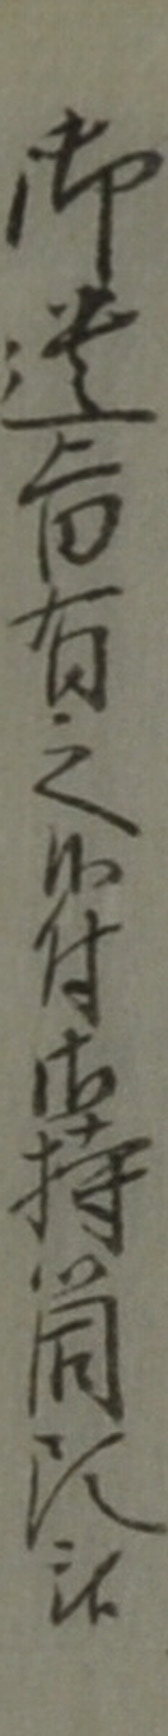御遺旨有之候付御持筒頭被
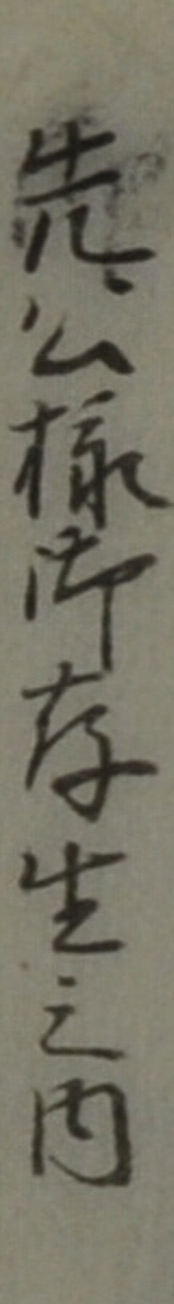先公様御存生之内
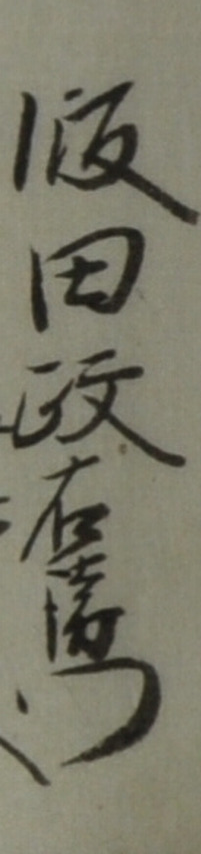飯田政右衛門
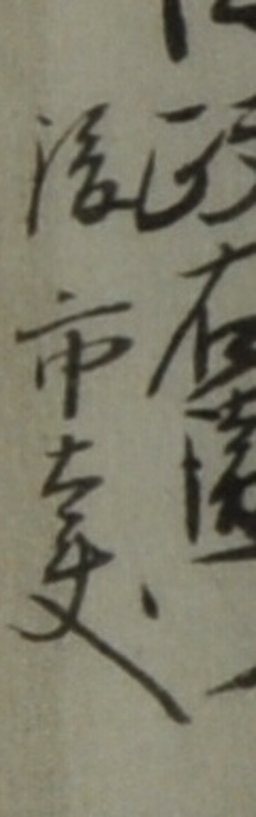後市太夫

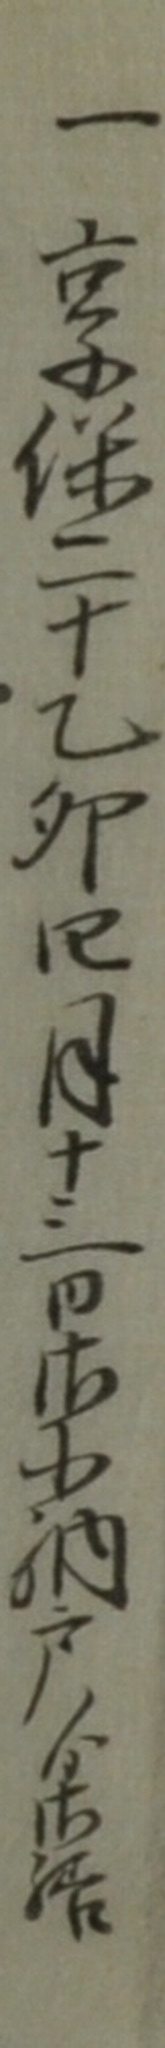一享保二十乙卯四月十三日御小納戸ゟ御路
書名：諸御役代々録（四）
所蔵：伊那市立高遠町図書館・合同会社AMANE
